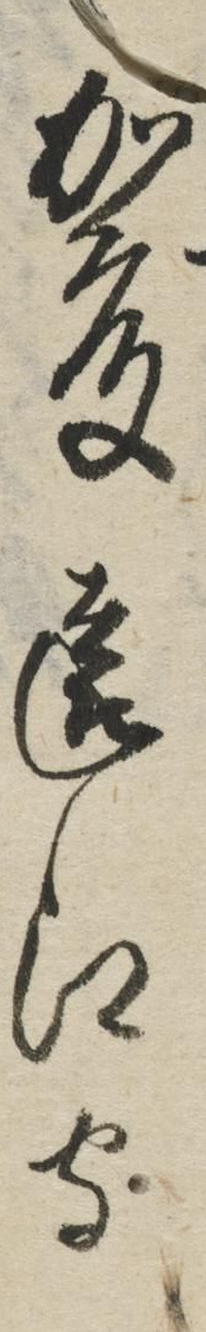加藤遠江守
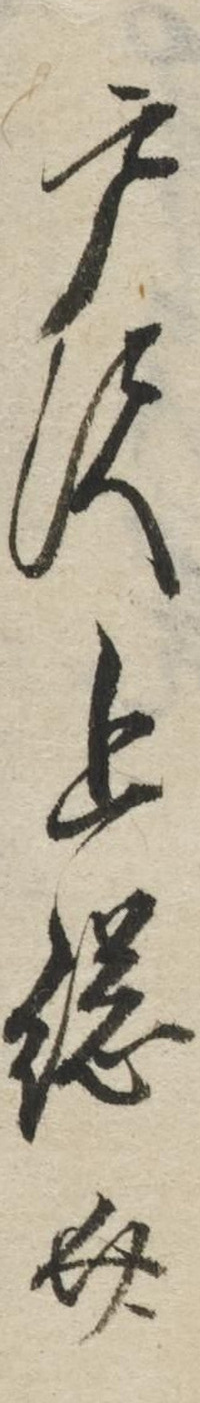戸沢上総介
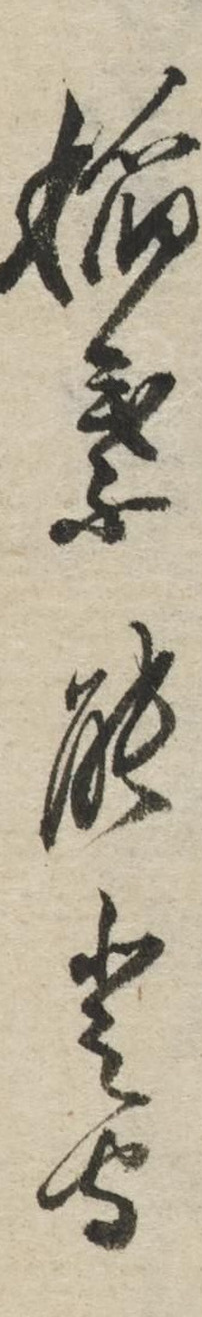稲葉能登守
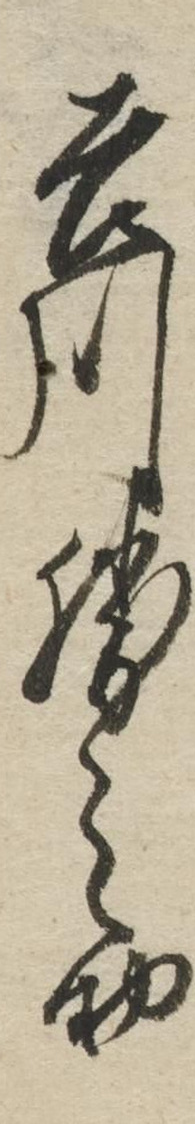吉川勝之助
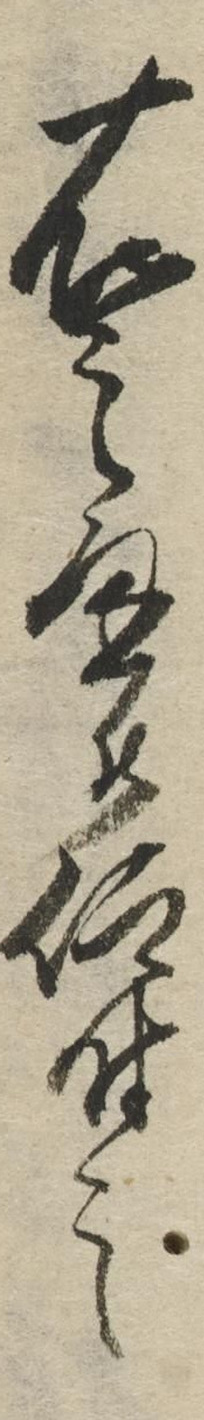右之通被仰付之

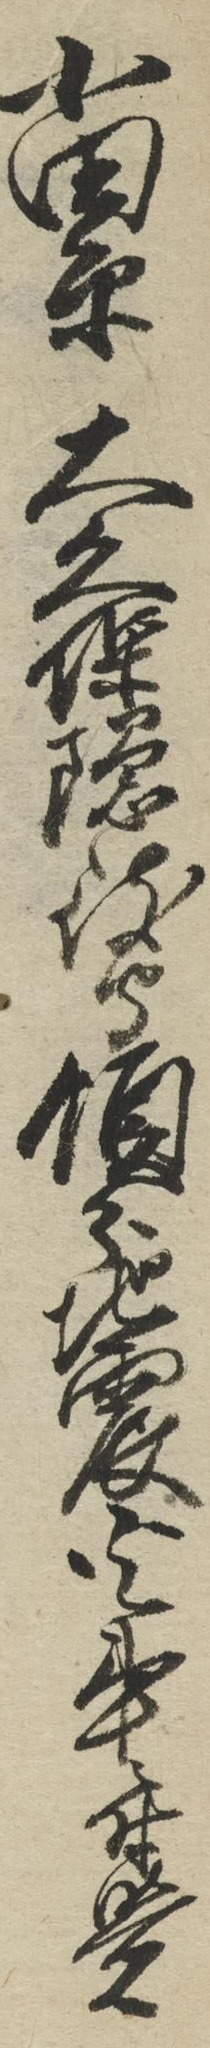小田原大久保隠岐守領分地震火事二付覚
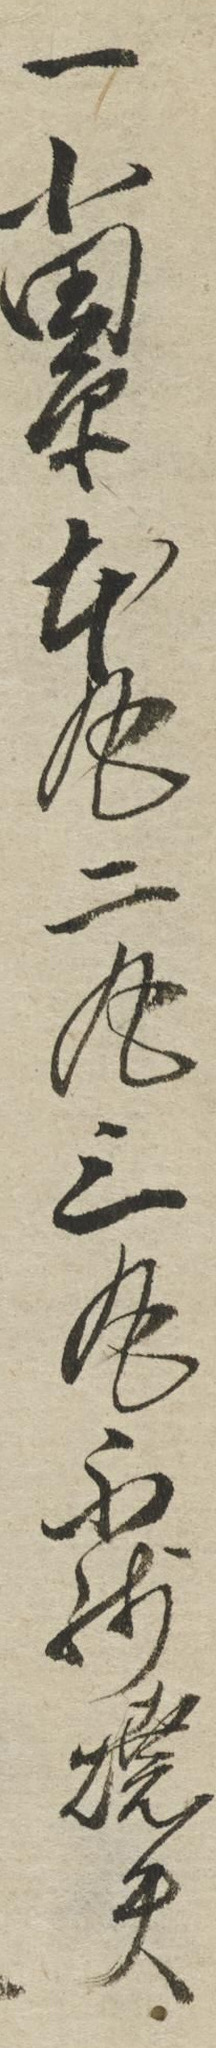一小田原本丸二丸三丸不残焼失
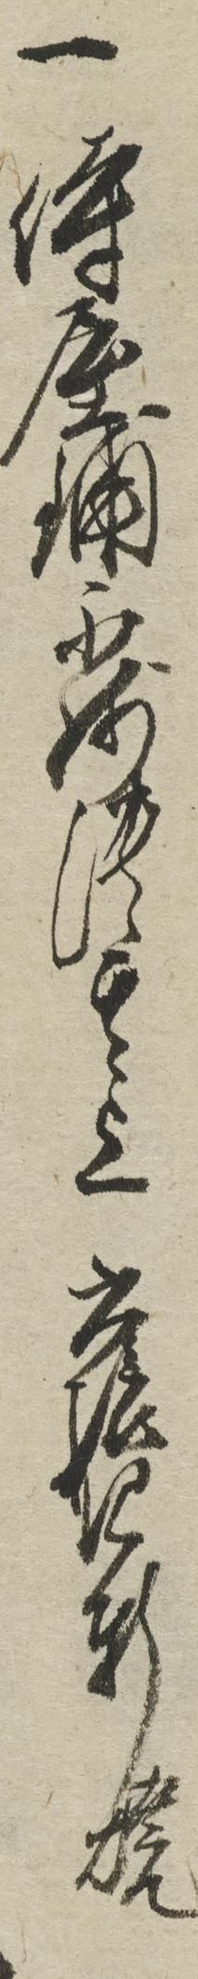一侍屋鋪不残潰其上六拾四軒焼
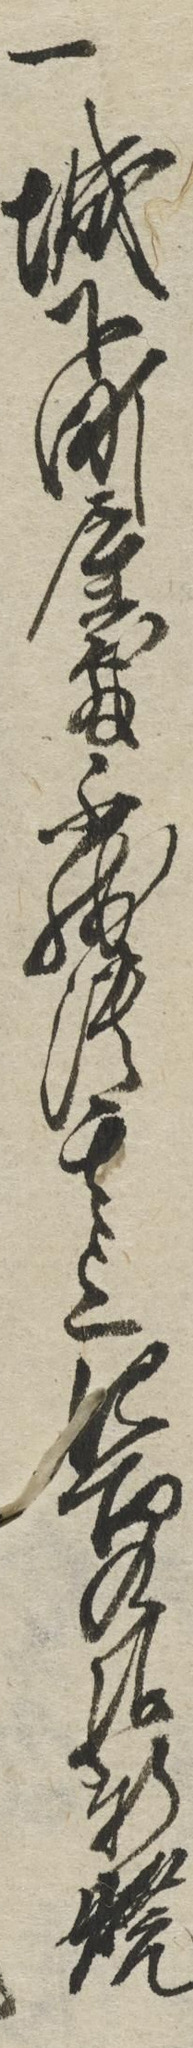一城下町屋敷不残潰其上四百九拾軒焼
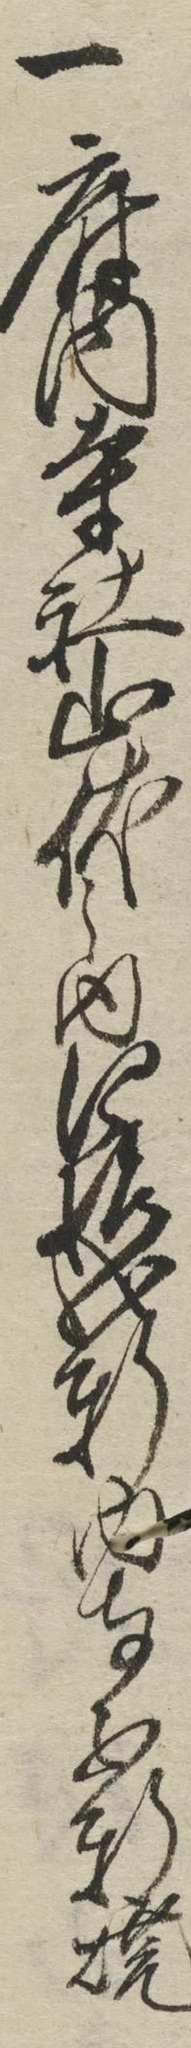一府内寺社山伏之内四拾弐軒内寺五軒焼
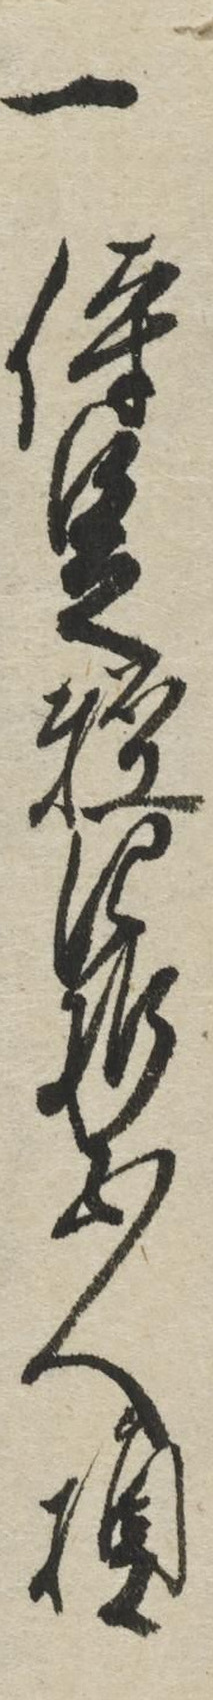一侍足軽四拾五人損
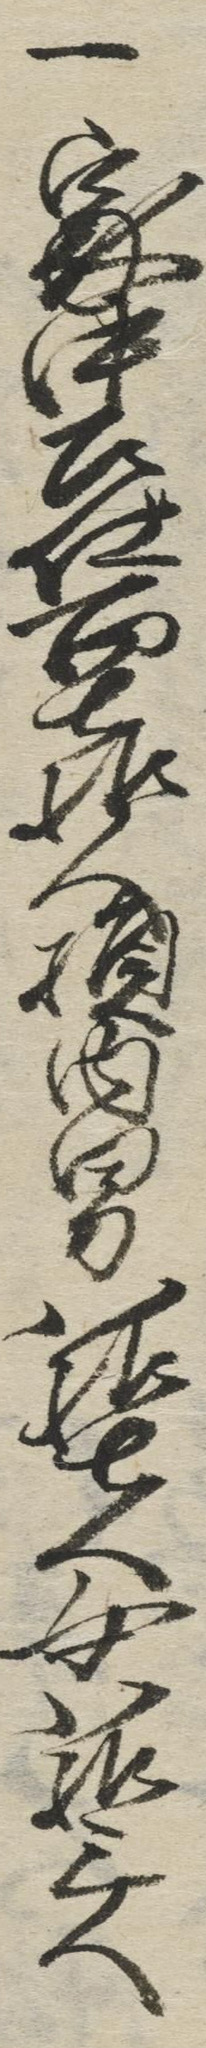一家中召使百七拾人損内男八拾七人女八拾三人
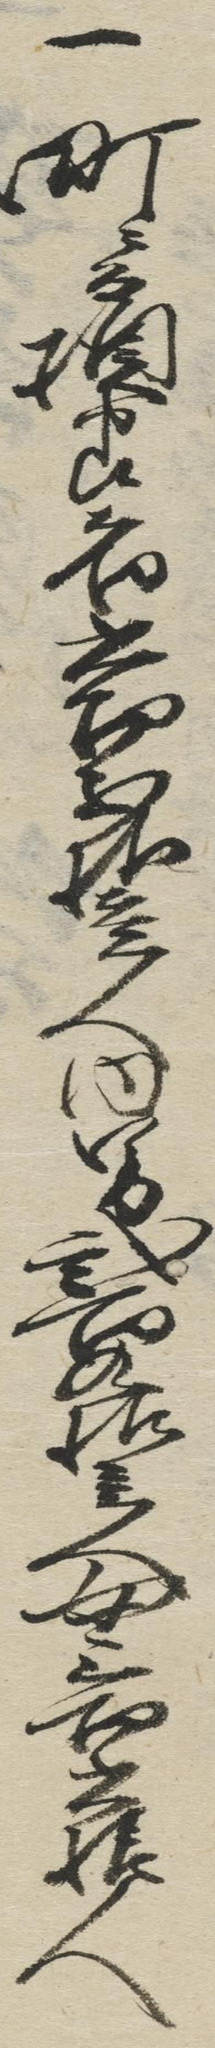一町二而損申候者六百五拾壱人男弐百九拾壱人女三百六拾人
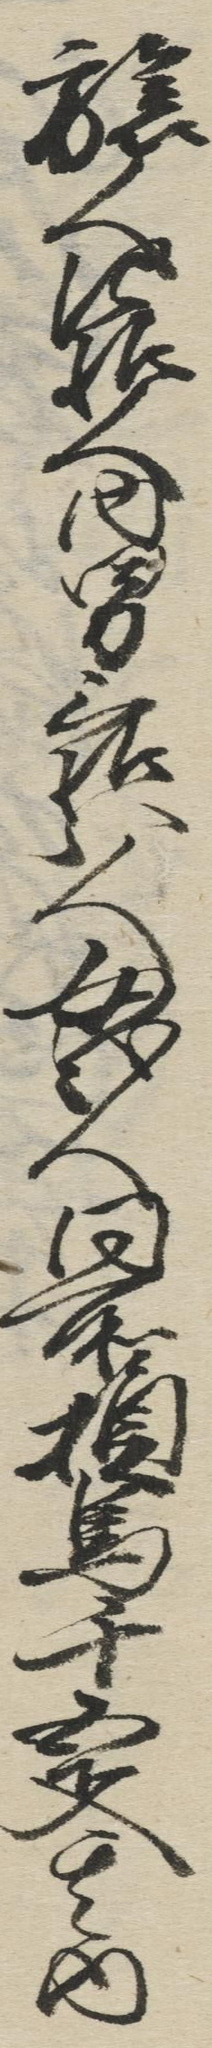旅人四拾人内男三拾八人女弐人同所損馬千五疋其内
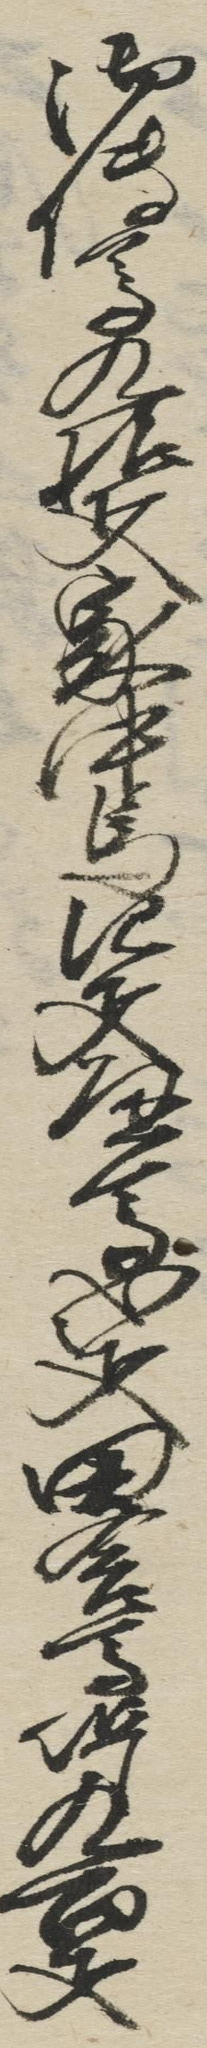御伝馬九拾疋家中馬四疋通馬弐疋田舎馬併九百疋
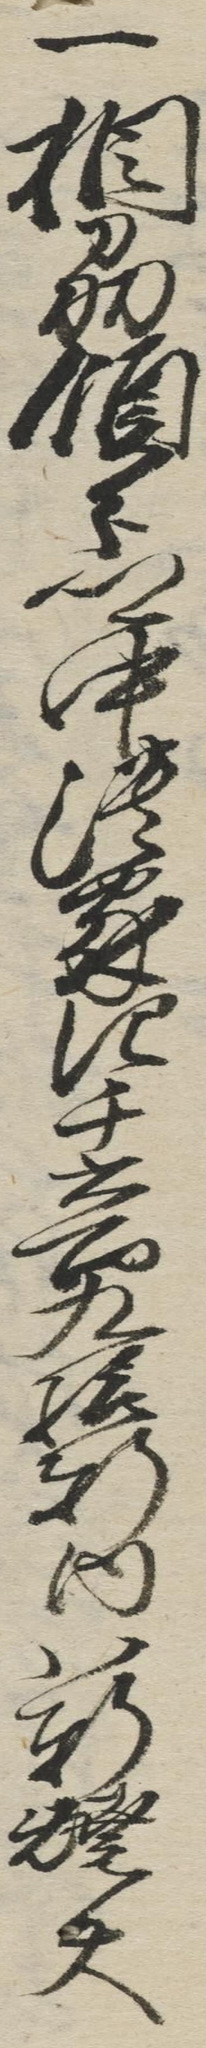一相州領分郷中潰家四千六百九拾軒内八軒焼失
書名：元禄地震記
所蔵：東京大学地震研究所図書室 Earthquake Research Institute Library, The University of Tokyo, JAPAN
